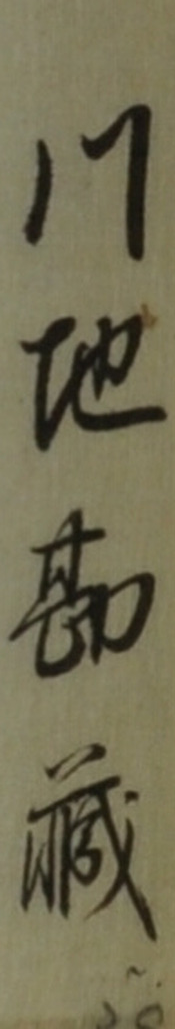川地勘蔵
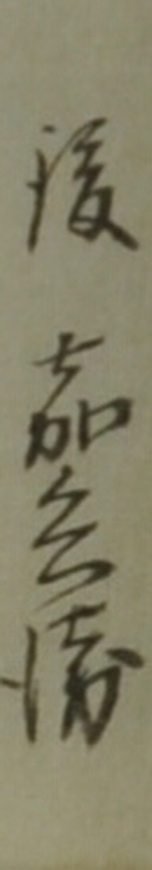後嘉兵衛
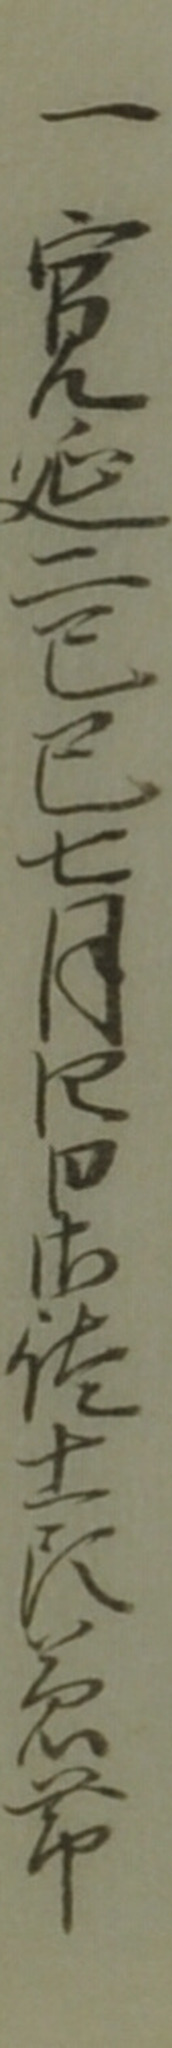一寛延二己巳七月四日御徒士頭兼帯
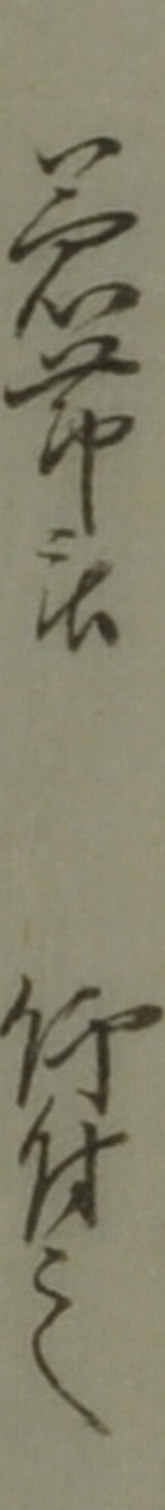兼帯被仰付之
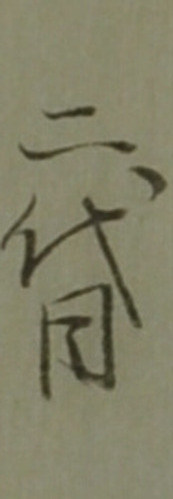二代目
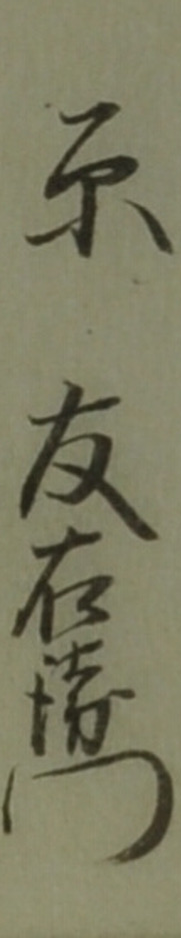原友右衛門
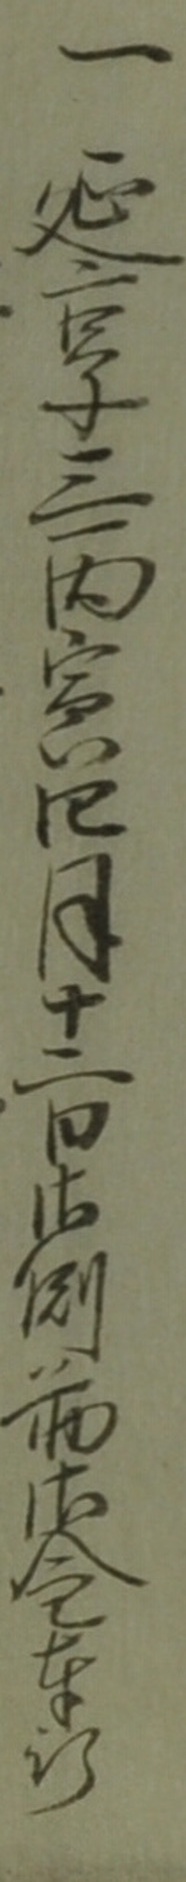一延享三丙寅四月十二日御側勤御金奉行
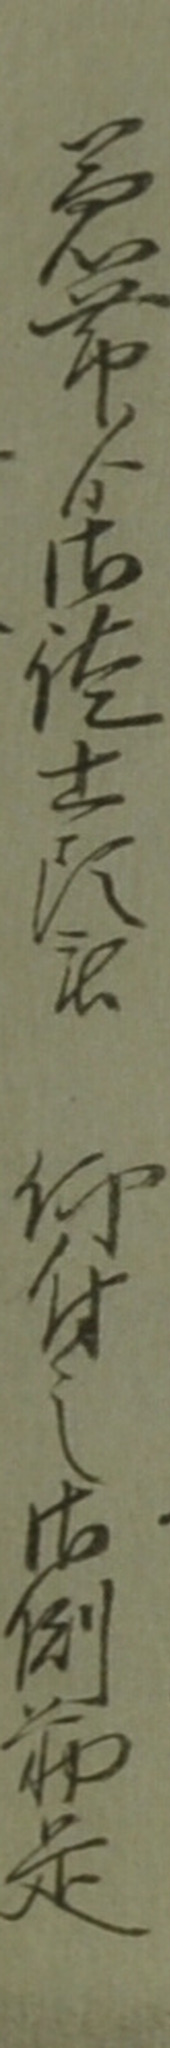兼帯ゟ御徒士頭被仰付之御側勤是
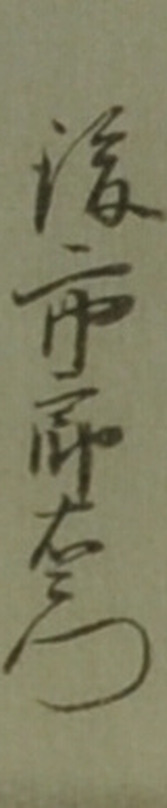後市郎右衛門
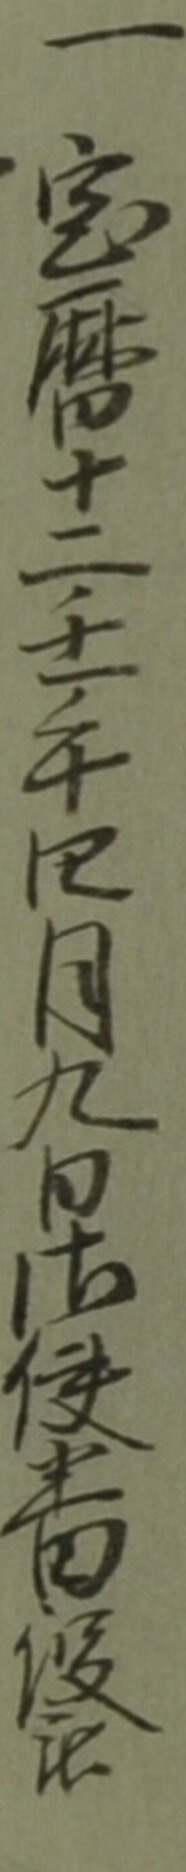一宝暦十二壬午四月九日御使番役被
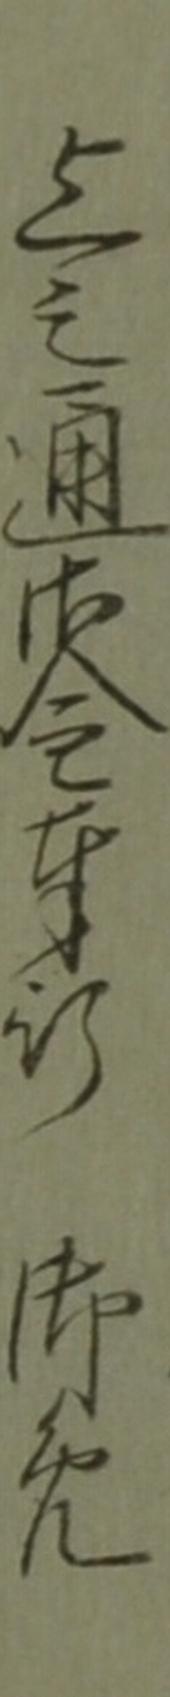迄之通御金奉行御免
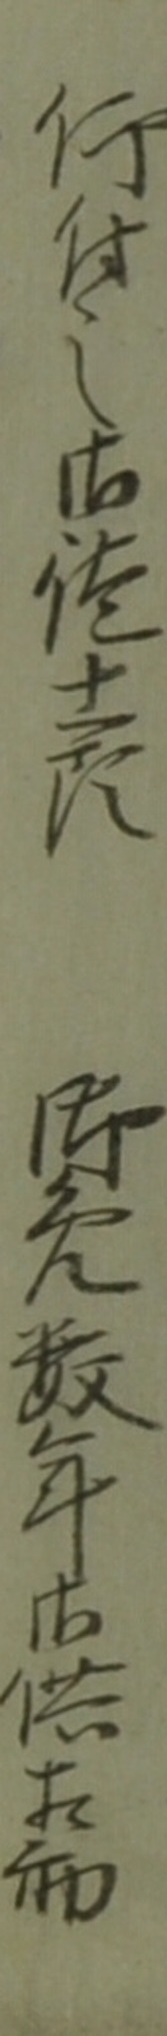仰付之御徒士頭御免数年御供相勤
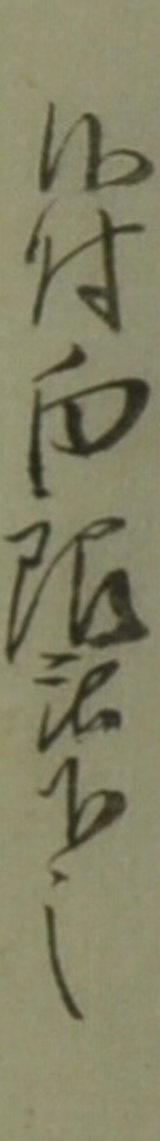候付白銀被下之

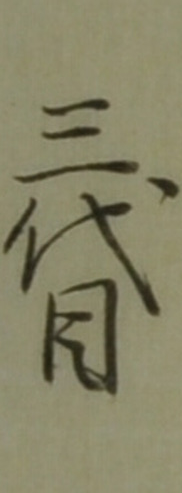三代目
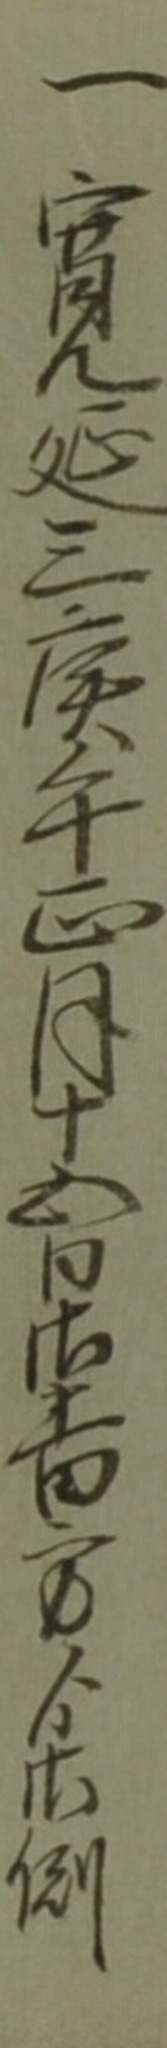一寛延三庚午正月十五日御番方ゟ御側
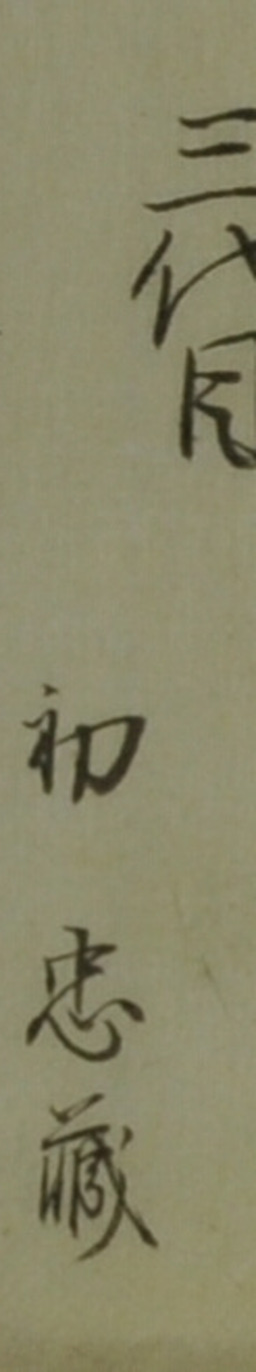初忠蔵
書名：諸御役代々録（六）
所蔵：伊那市立高遠町図書館・合同会社AMANE
